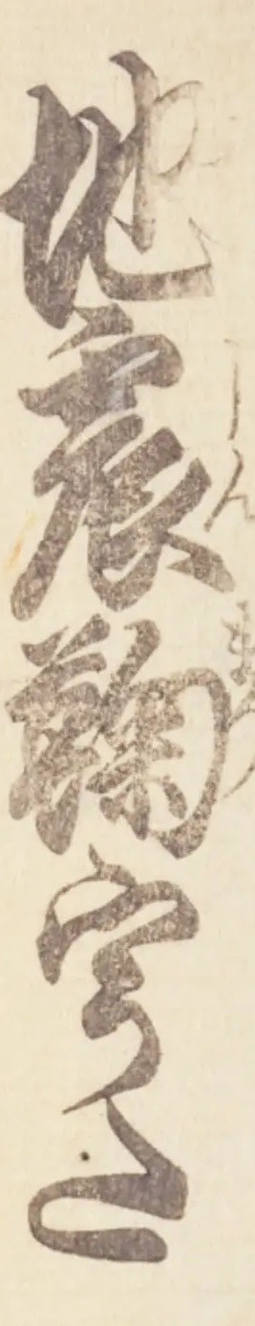地震鞠うた
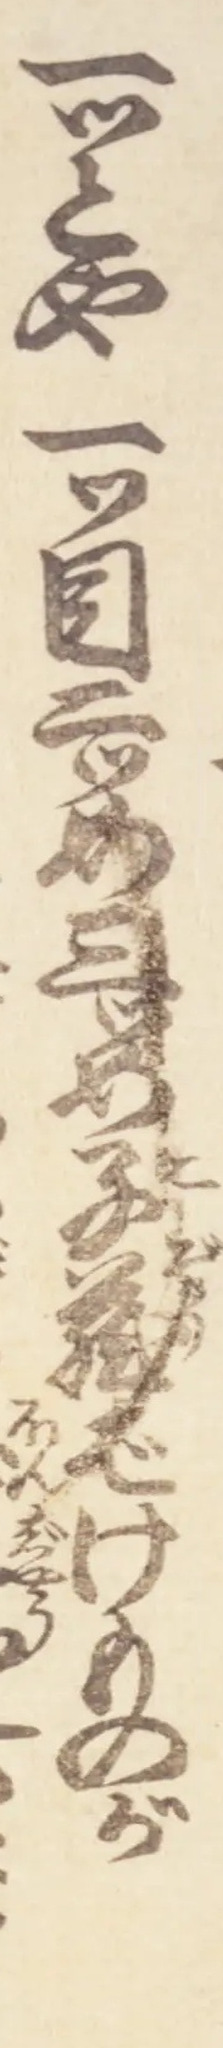一ツとや一ツ目二ツめ三ツめ子蔵ばけものが
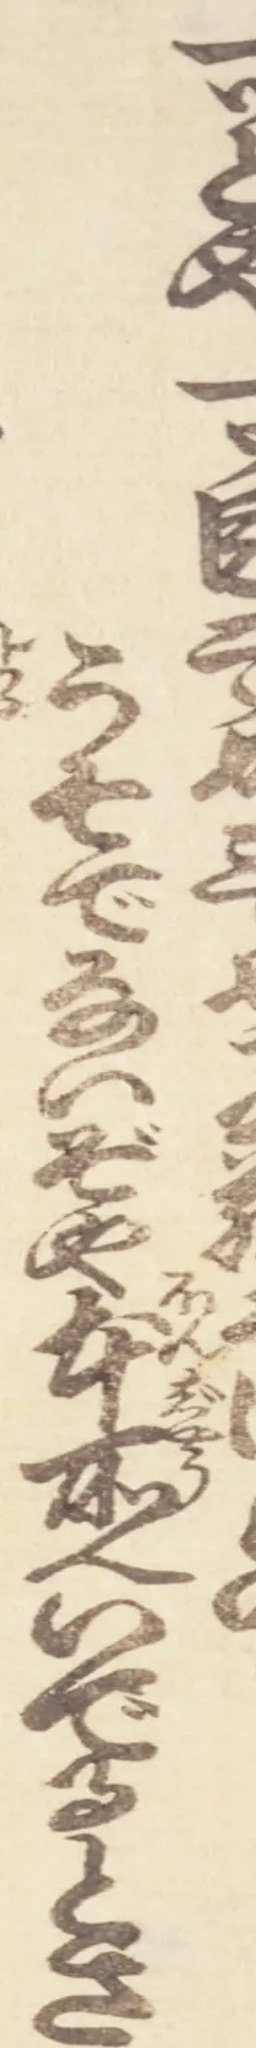うそでないぞや本所へいでるとさ
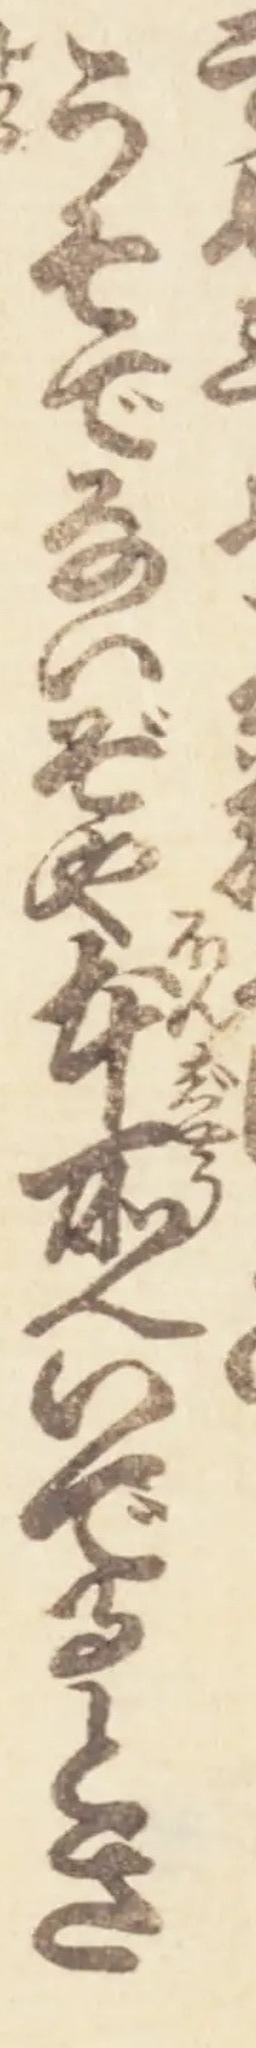うそでないぞや本所へいでるとさ
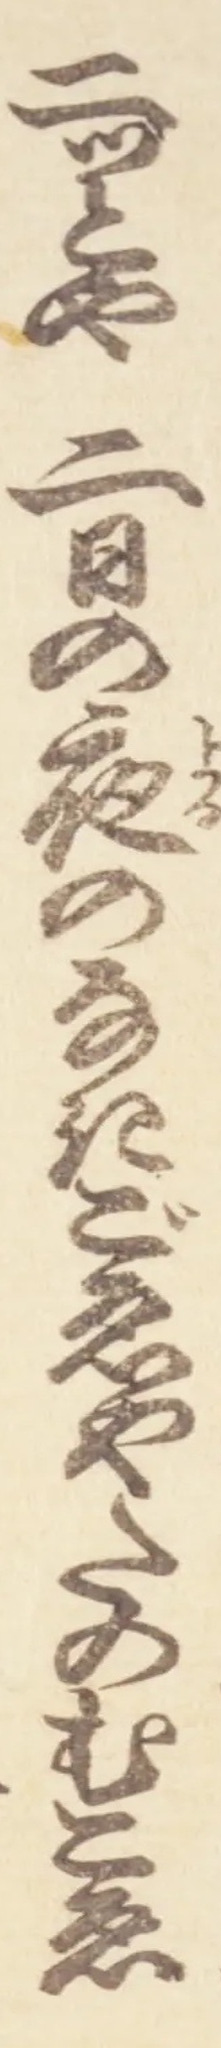二ツとや二日の夜のなきごゑやたのむこゑ
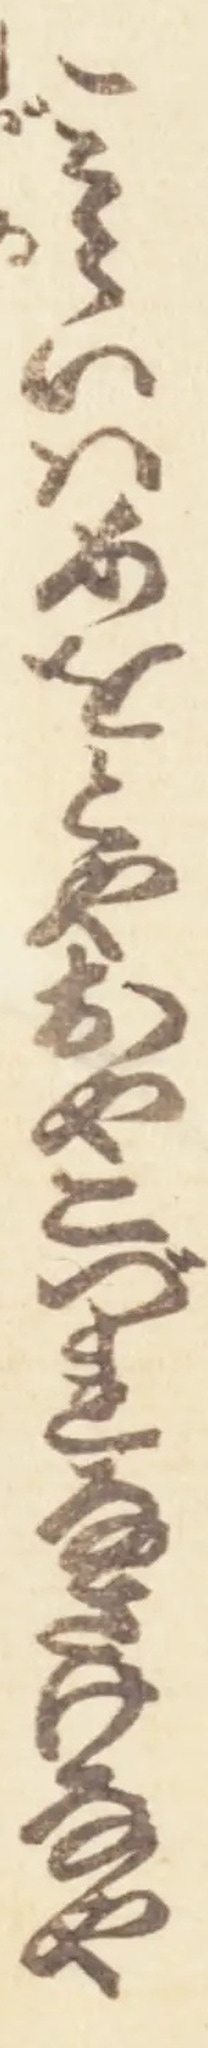ミヽいはめをとやおやこづれなさけなや
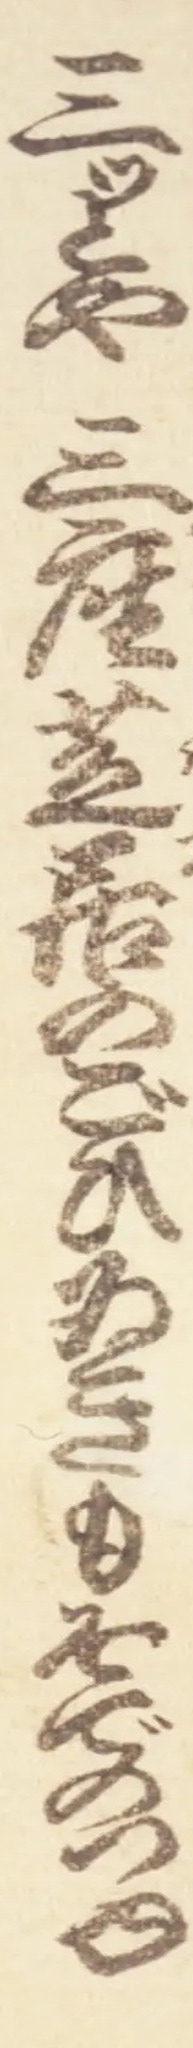三ツとや三座芝居のごひゐきもそでのつゆ
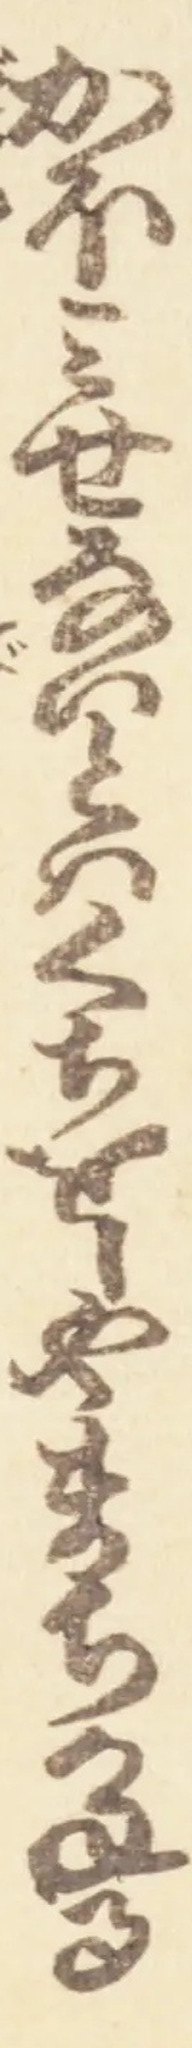かほみせないとはくちをしやまちかねる
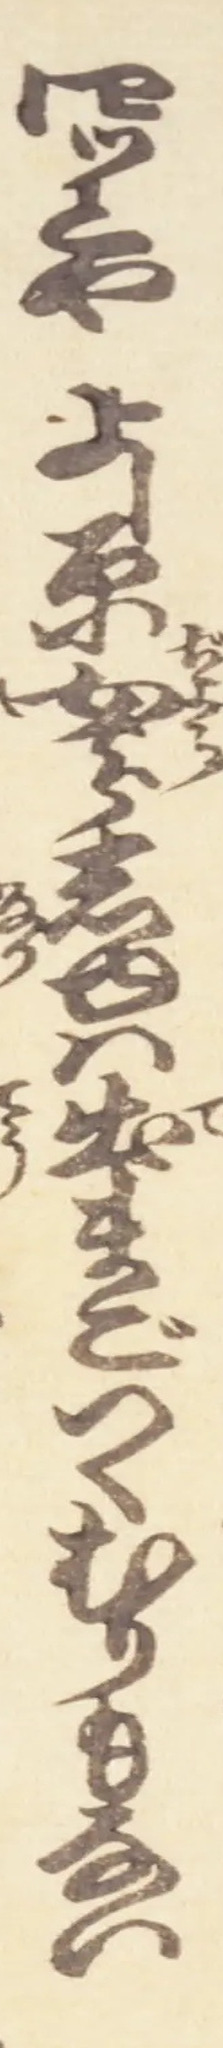四つとやよし原女郎しゆは出まごつくむりもない
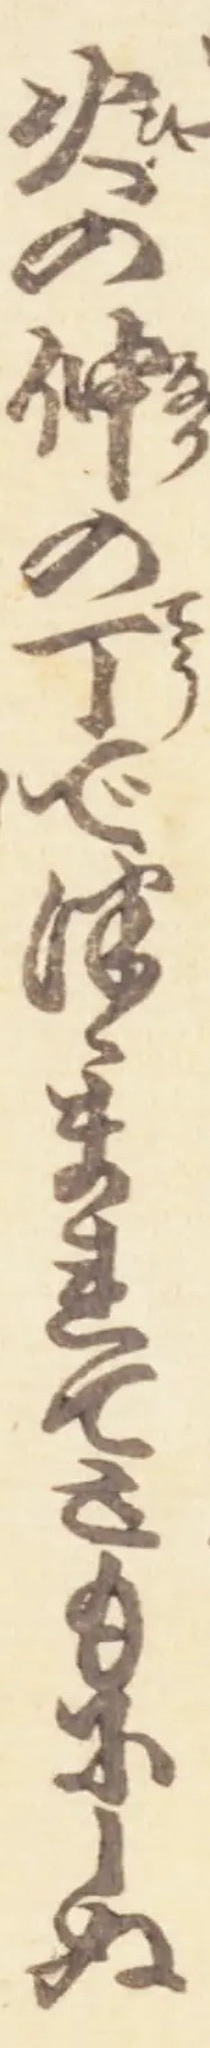火の仲の丁でつゝまれてともにしぬ
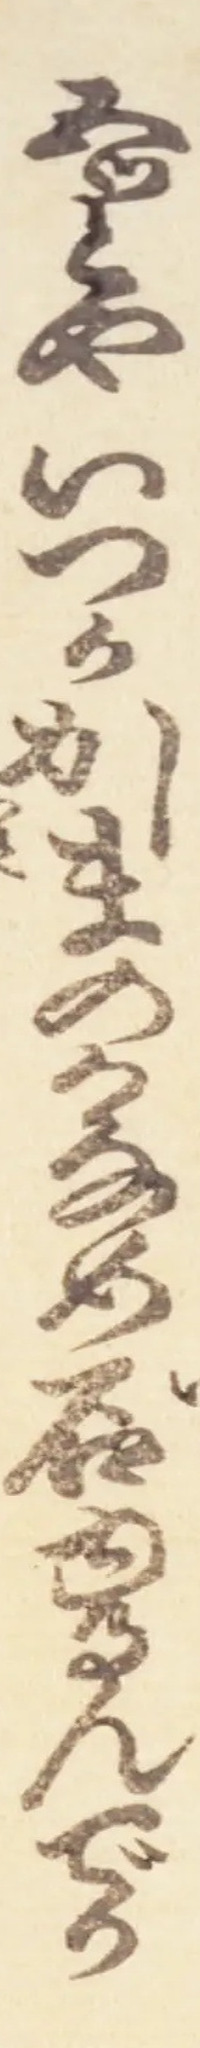五ツとやいつかかしまのかなめ石ゆるんでか
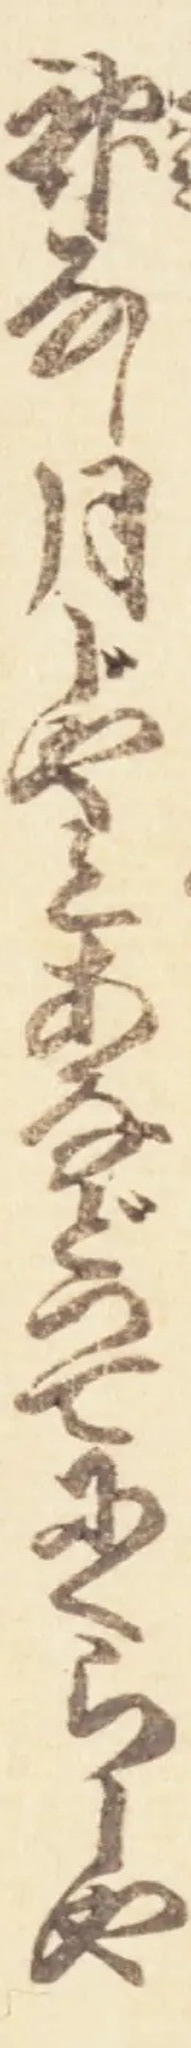神なし月じやとあなどつてにくらしや
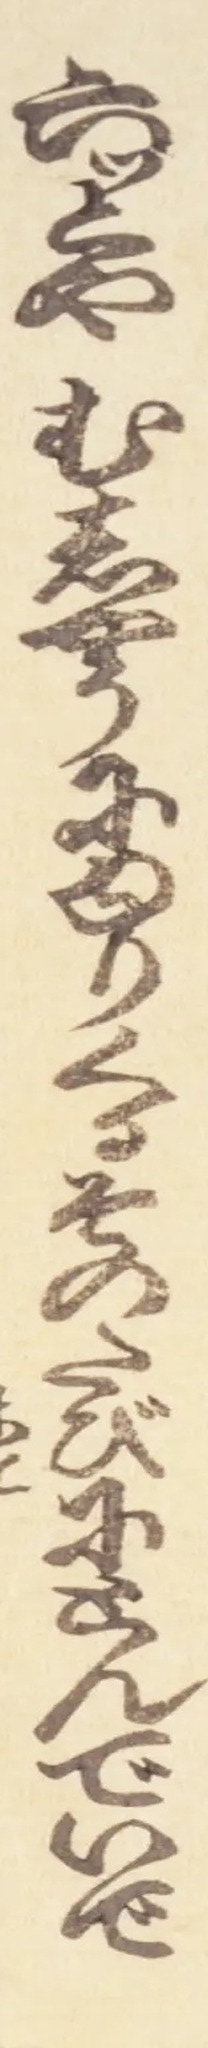六ツとやむしやうにゆりくるそのたびにとんでいで
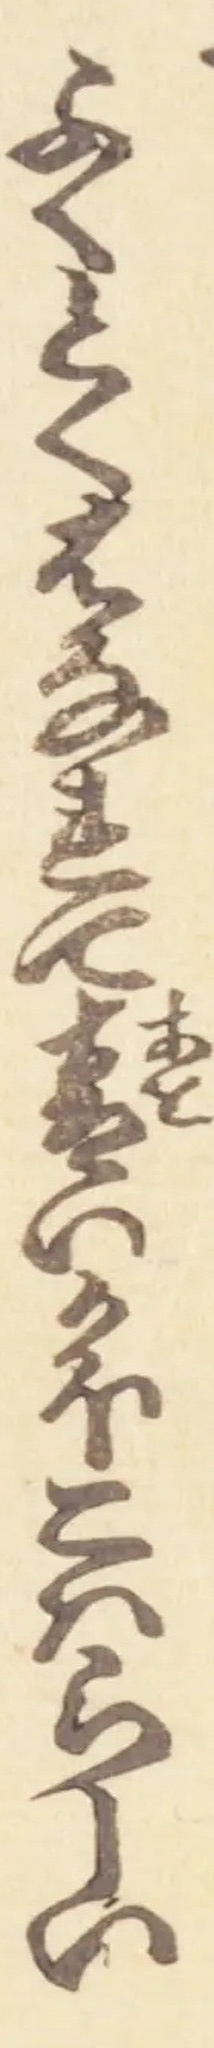よくとくはなれて青いかほこはらしい
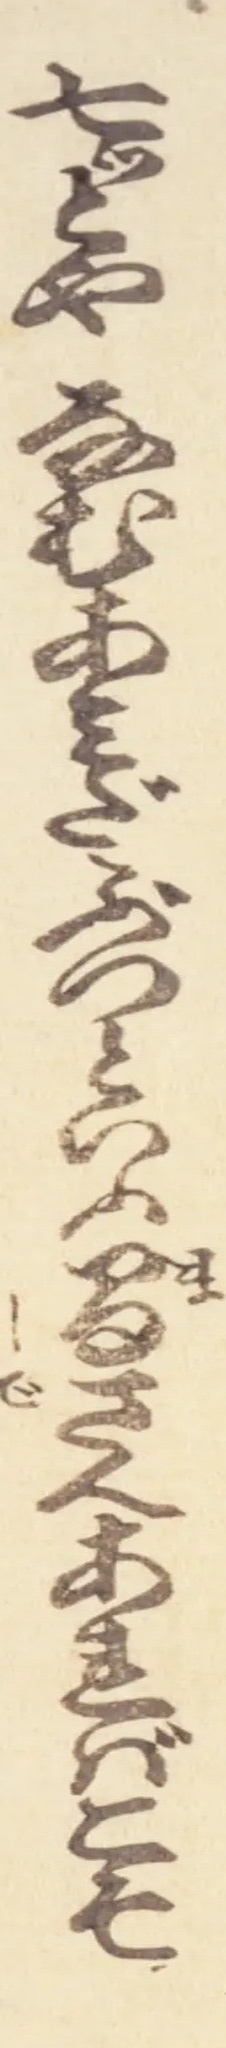七ツとやなむあみだぶつといふ間さへあればこそ
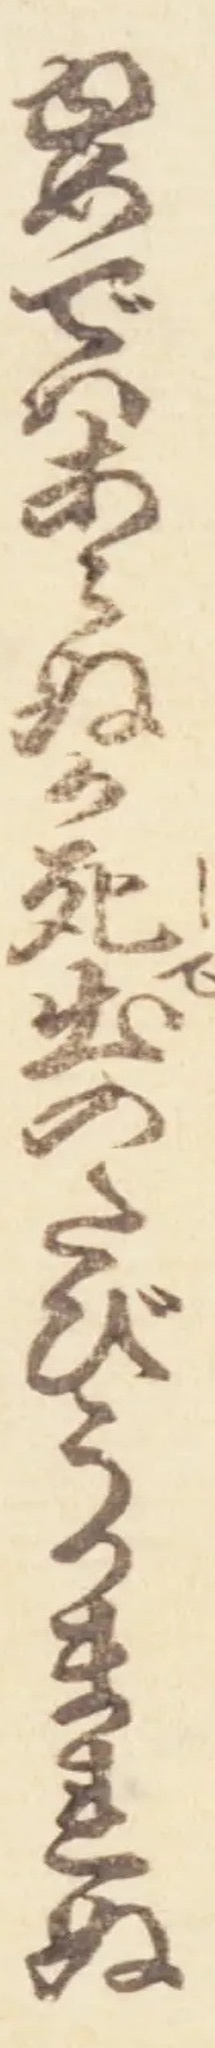ゆめではあらぬか死出のたびうかまれぬ
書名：地震鞠うた
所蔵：国立国会図書館 National Diet Library, JAPAN
